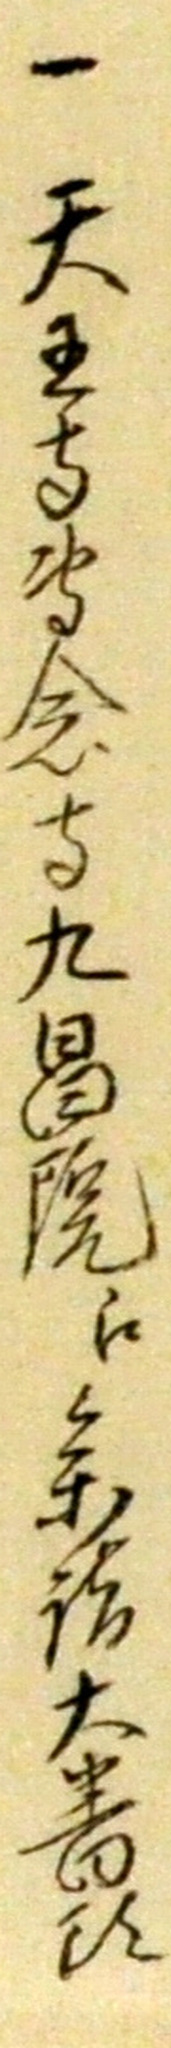一天王寺専念寺九昌院え参詣大番頭
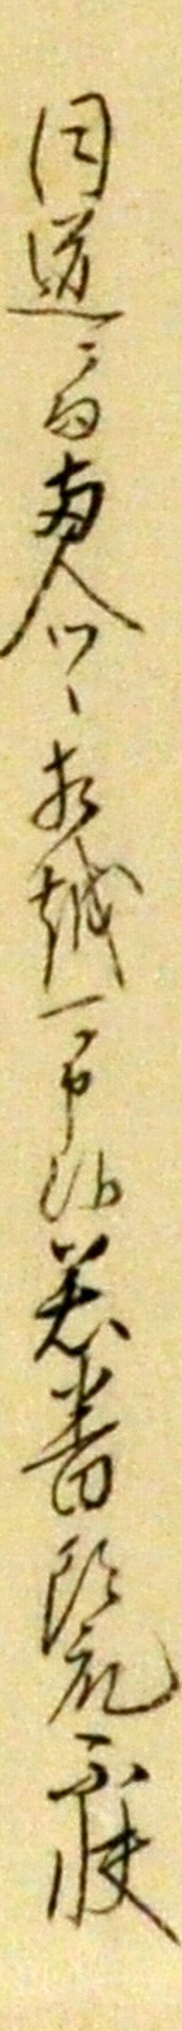同道に而両人ツヽ相越可申候若番頭衆不快
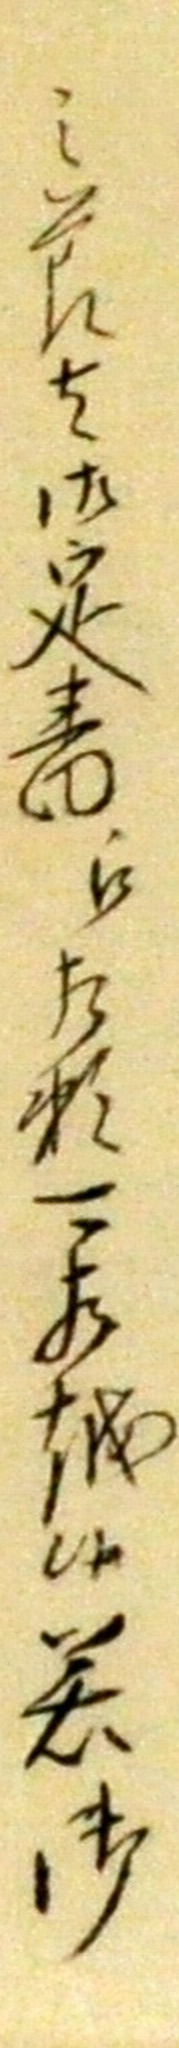之節は御定番え相頼可相越候若御
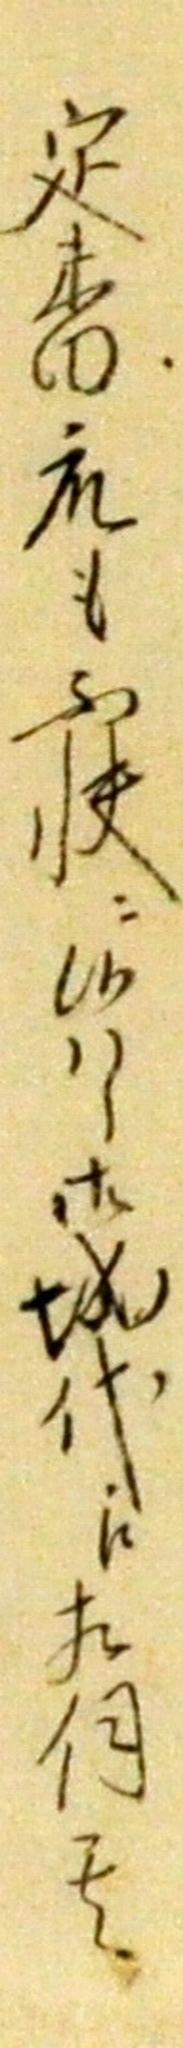定番衆も不快に候はゝ御城代え相伺其
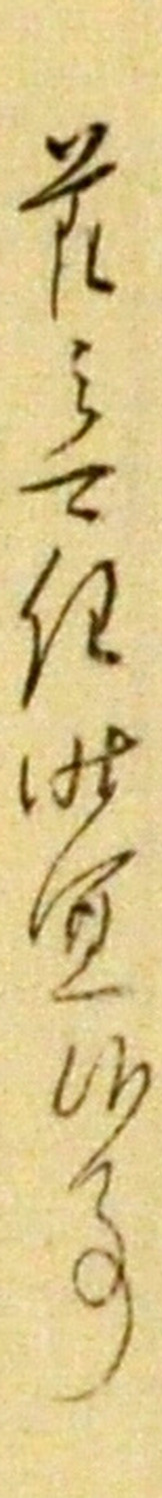節之可任時宜候事
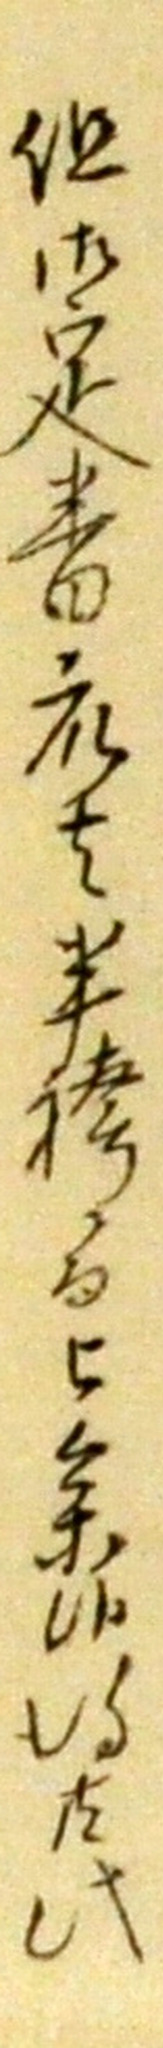但御定番衆は半袴に而被参候得共此
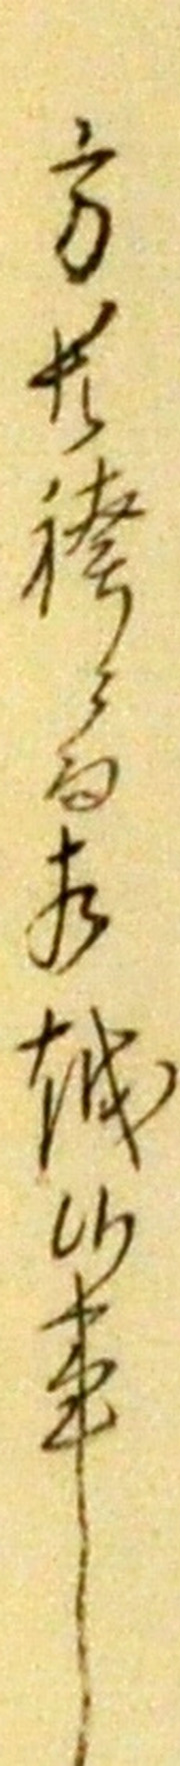方長袴に而相越候事
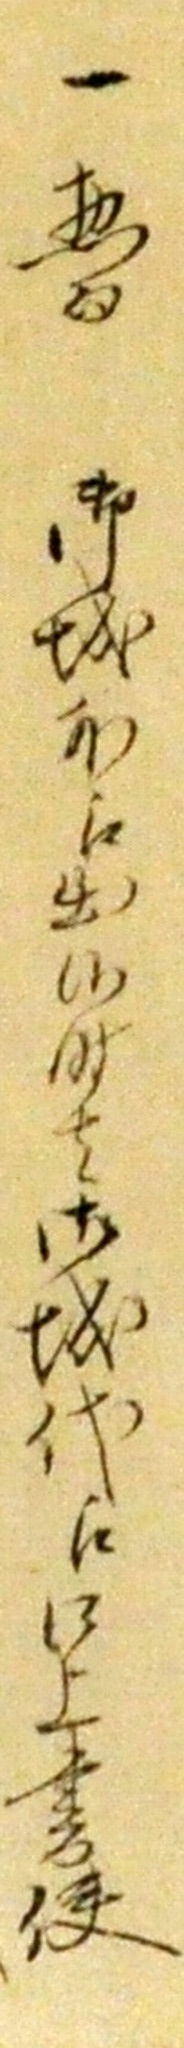一惣而御城外え出候時は御城代え口上書使
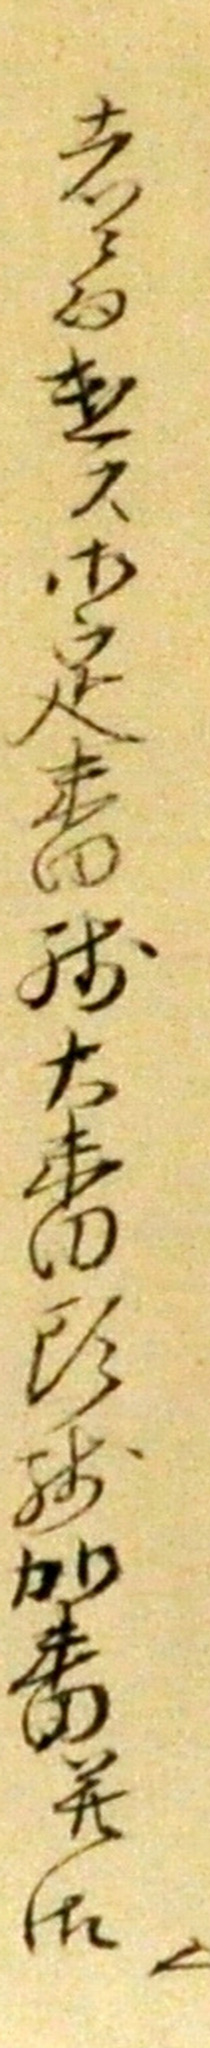者に而遣ス御定番残大番頭残加番并御
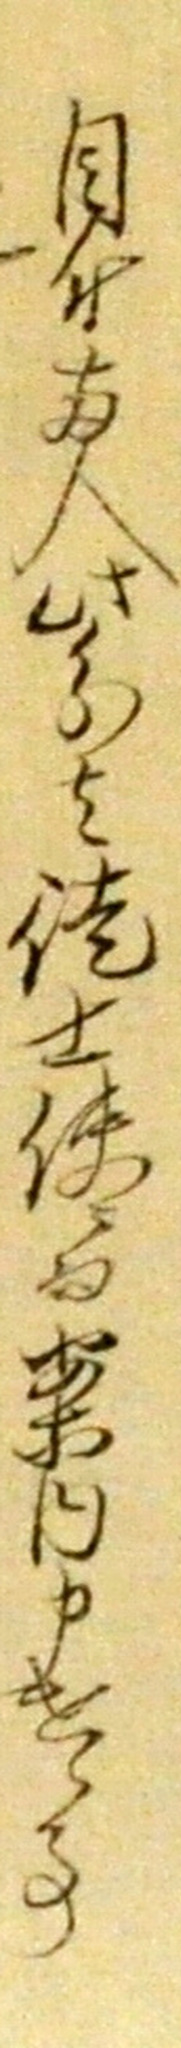目付両人此分は徒士使に而案内申遣候事
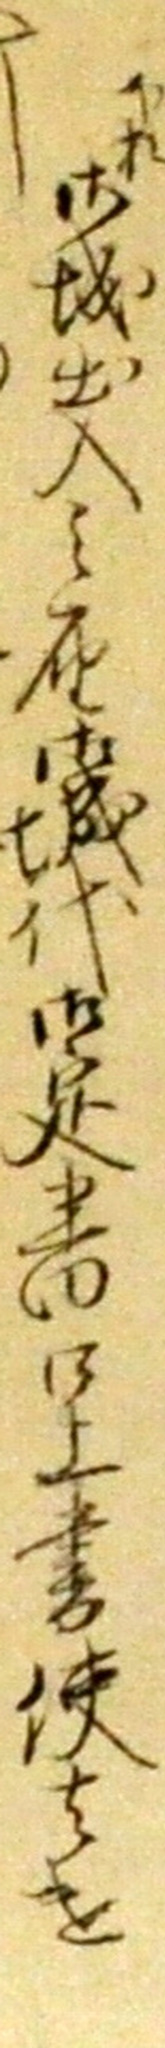下札御城出入之届御城代御定番口上書使者遣
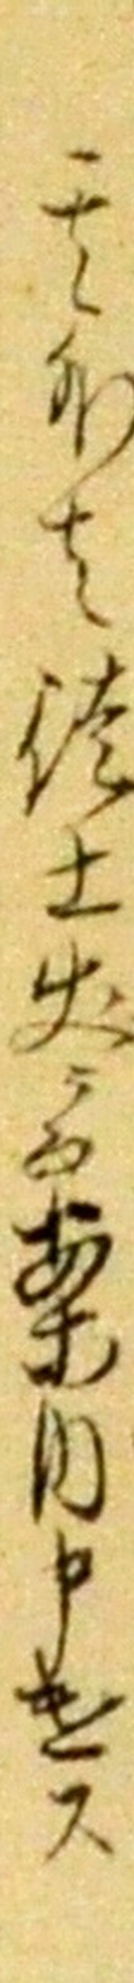其外は徒士使に而案内申遣ス
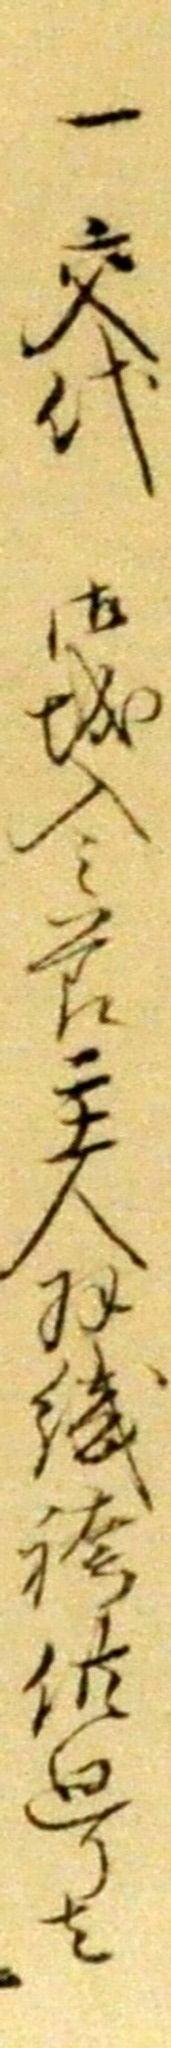一交代御城入之節主人羽織袴供廻りは
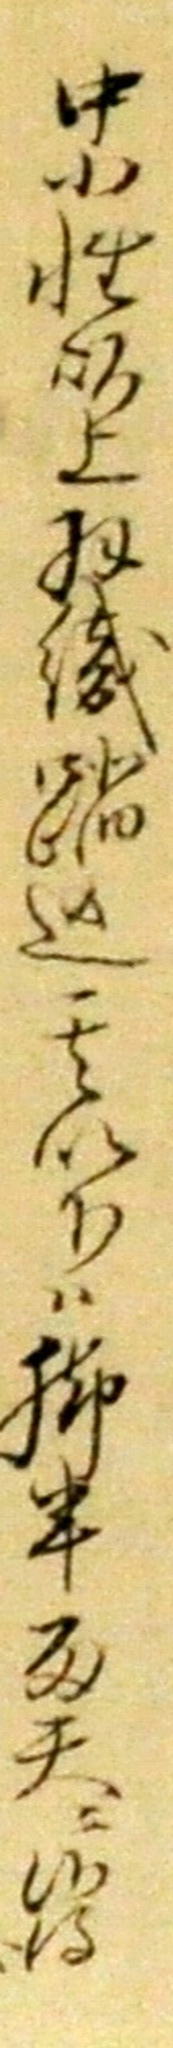中小性以上羽織踏込其以下は脚絆雨天に候得ば
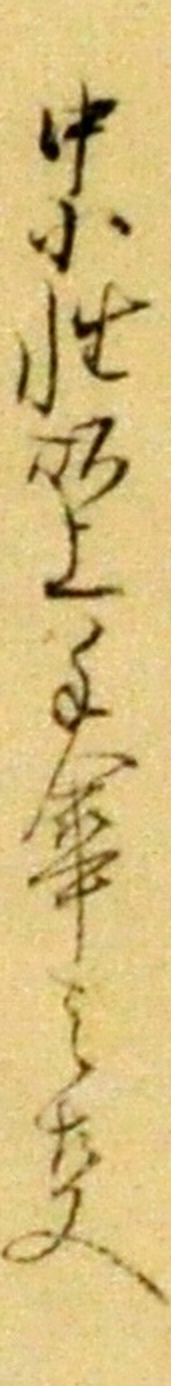中小性以上手傘之事
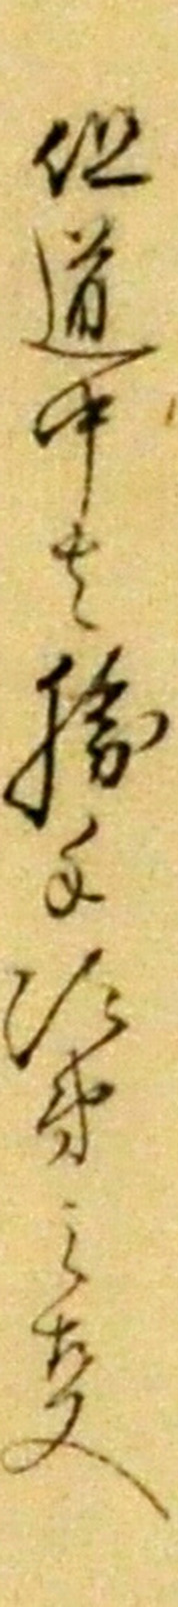但道中は勝手次第之事
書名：大阪加番関係諸書留〔一括〕
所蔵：伊那市立高遠町図書館・合同会社AMANE
